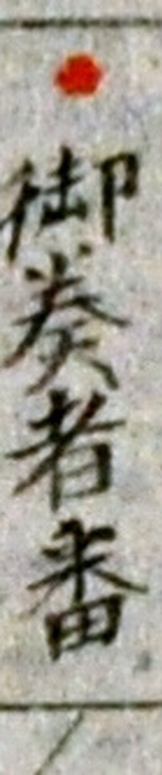御奏者番
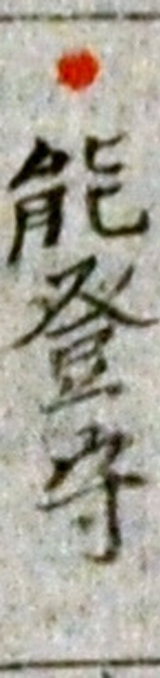能登守
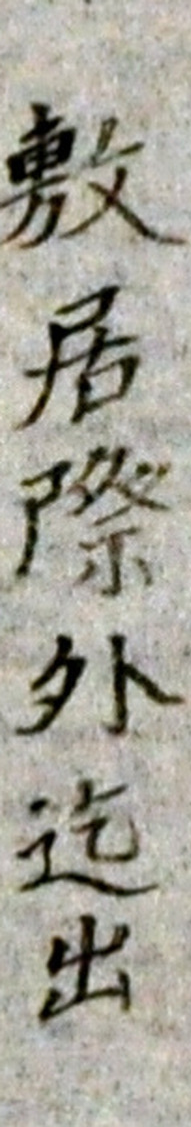敷居際外迄出
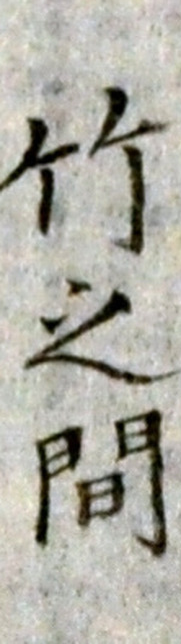竹之間
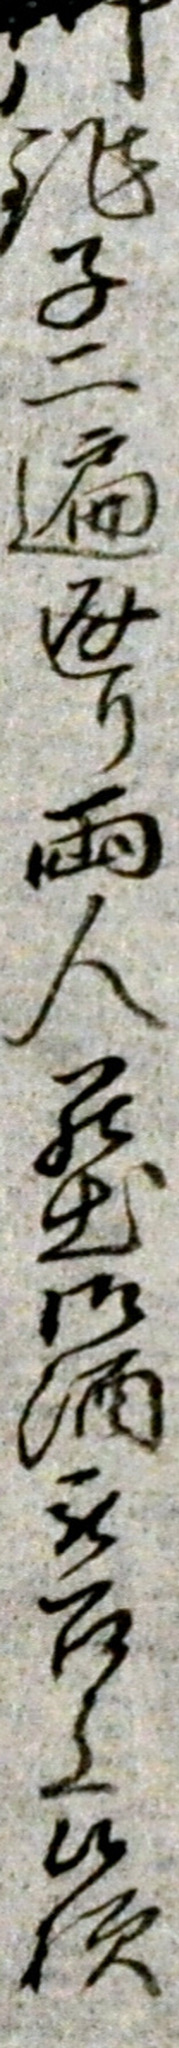御銚子二遍通り両人罷出御酒被召上候様
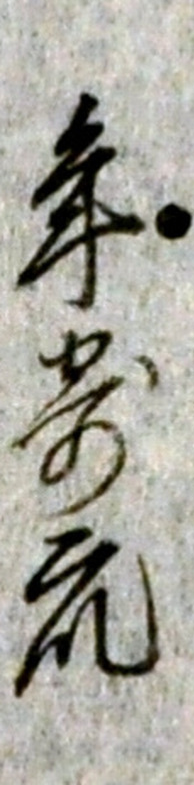年寄衆
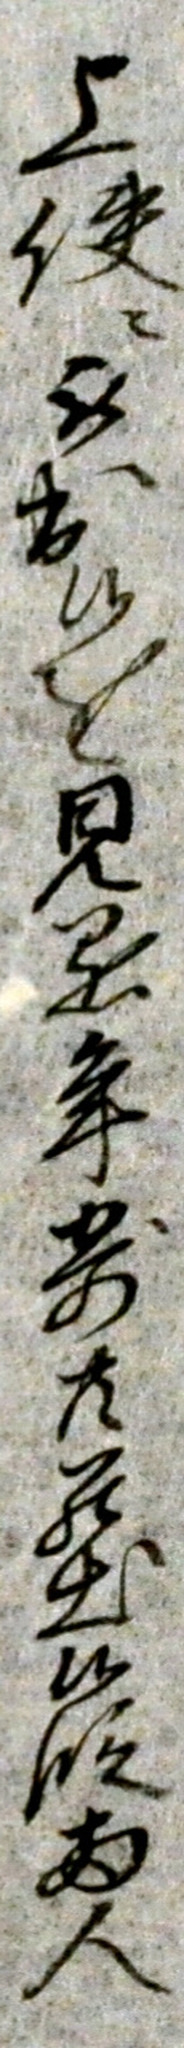上使ニ被出候を見年寄共罷出候段両人
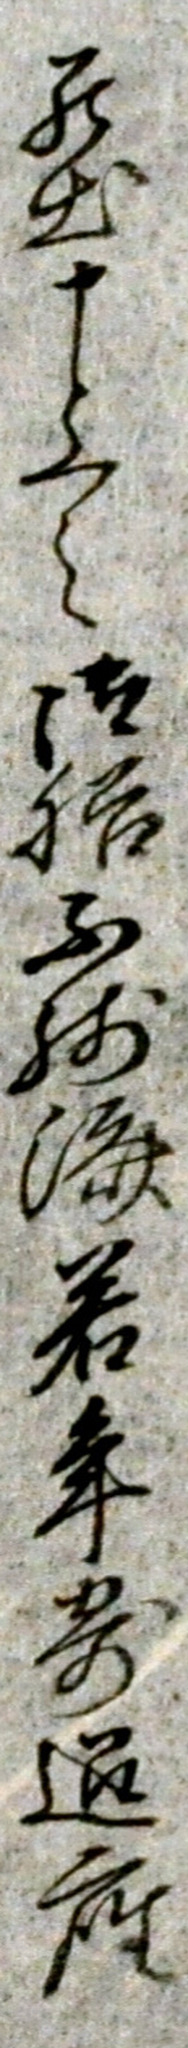罷出申上之御膳不残済若年寄退座
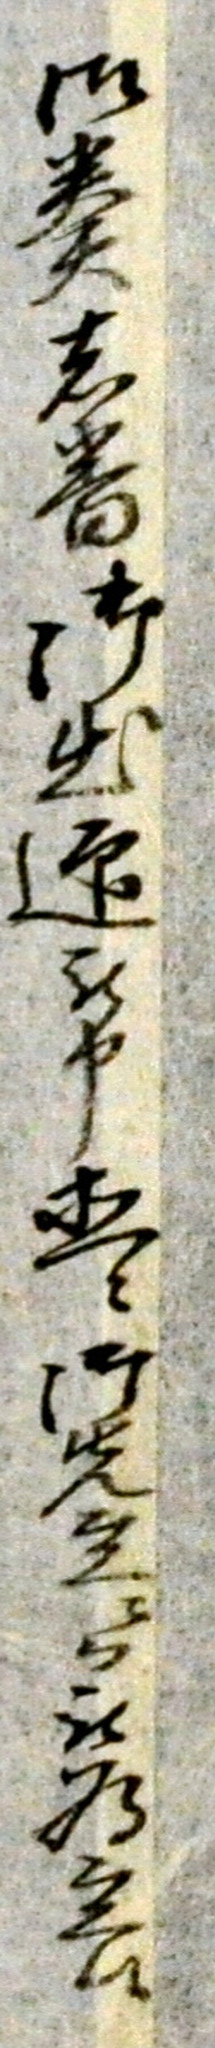御奏者番御出迎被申直ニ御先立ニ而被為立候
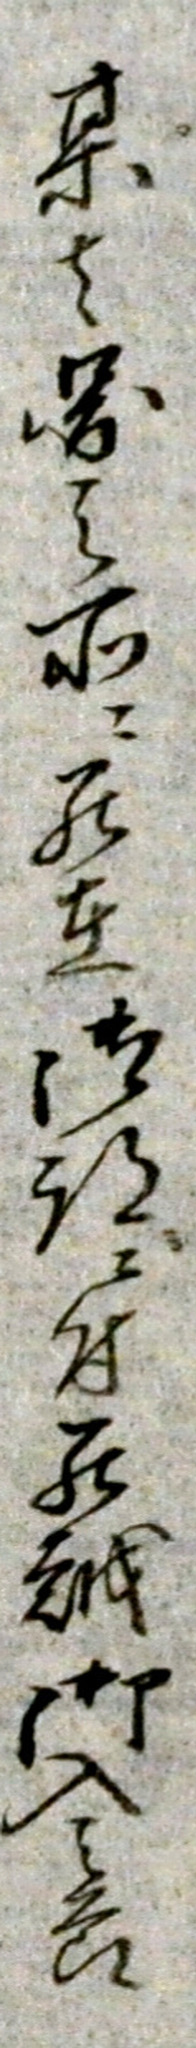某は圖之所に罷在御跡ニ付罷越御入之節
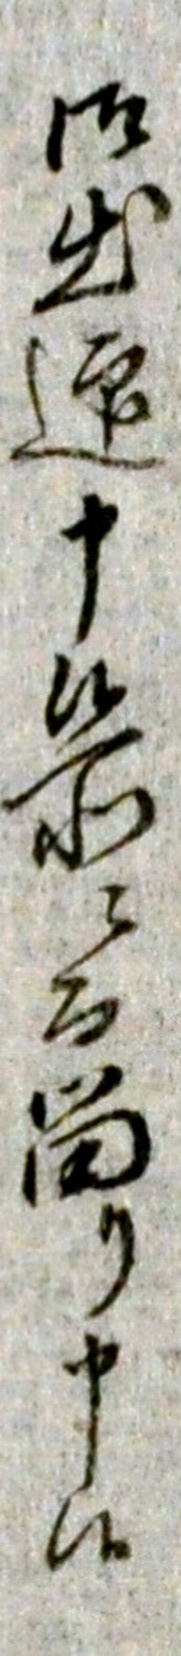御出迎申候所ニ而留り申候
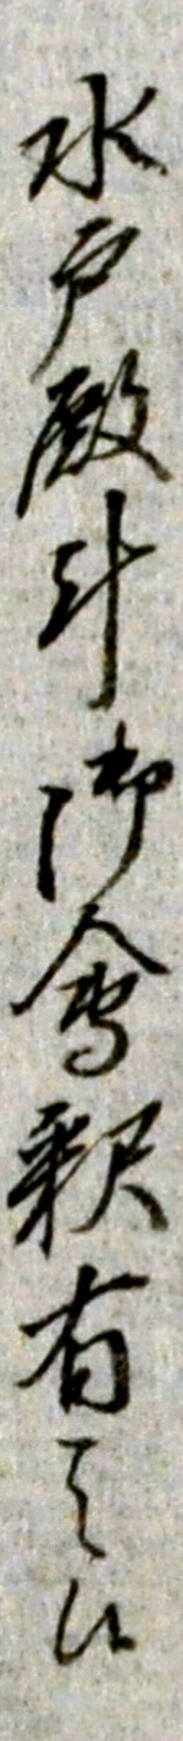水戸殿斗御會釈有之候

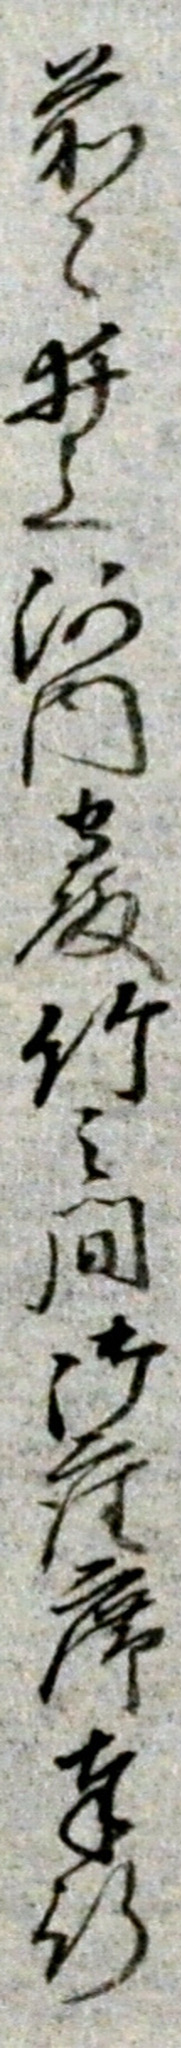前々井上河内守殿竹之間御座席奉行
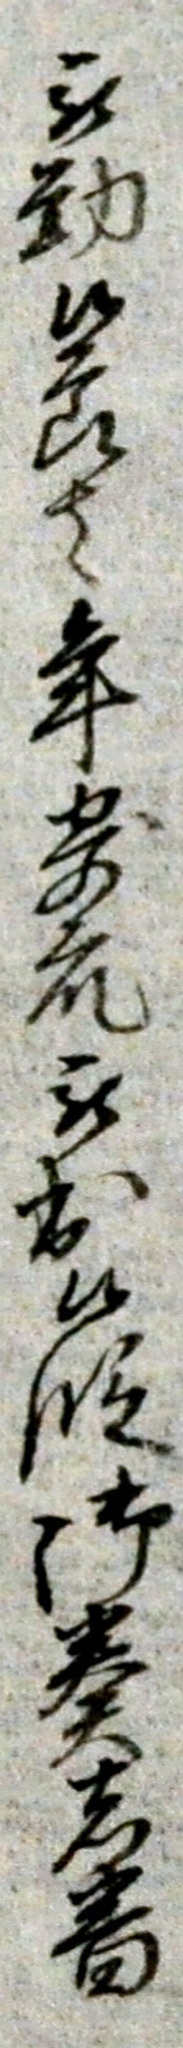被勤候節は年寄衆被出候段御奏者番
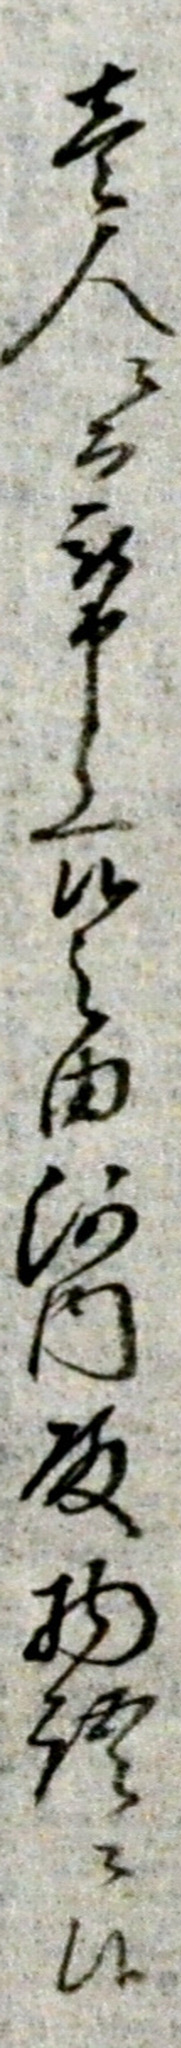壱人ニ而被申上候之由河内殿物語ニ候
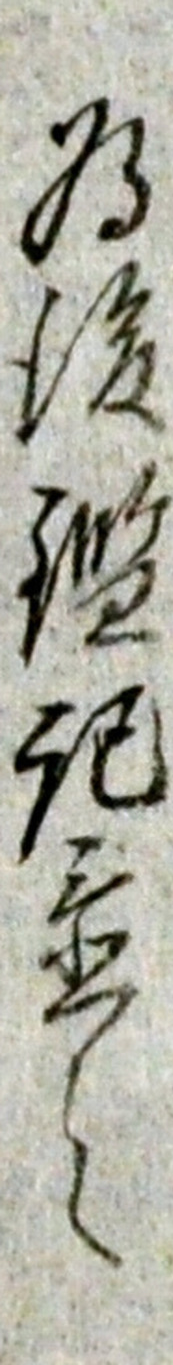為後鑑記置之
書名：竹ノ間御座席奉行勤方控外
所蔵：伊那市立高遠町図書館・合同会社AMANE
